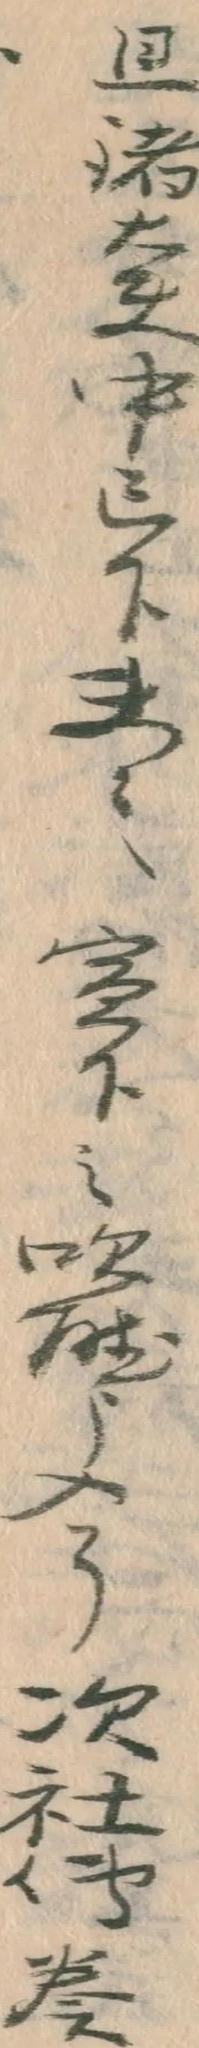且諸大夫中已下夫々へ宣下之吹聴申入了次社傳奏
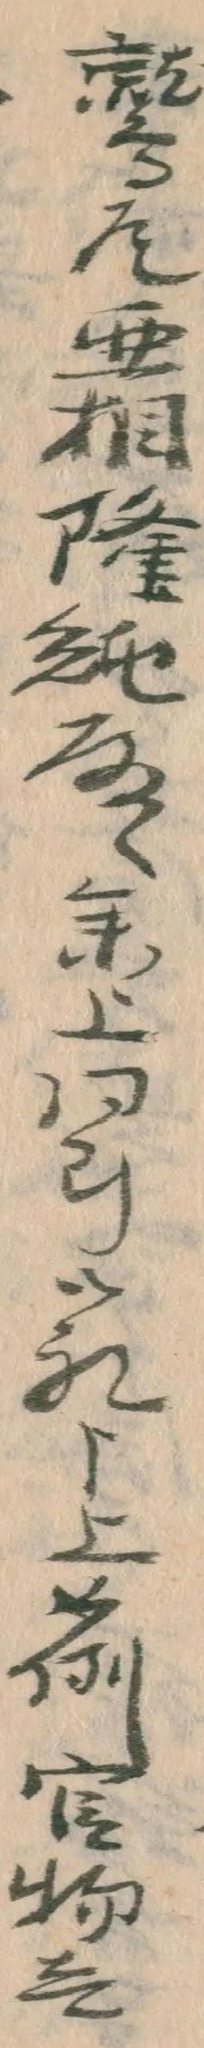鷲尾亜相隆純殿へ参上同断御礼申上如例官物壱
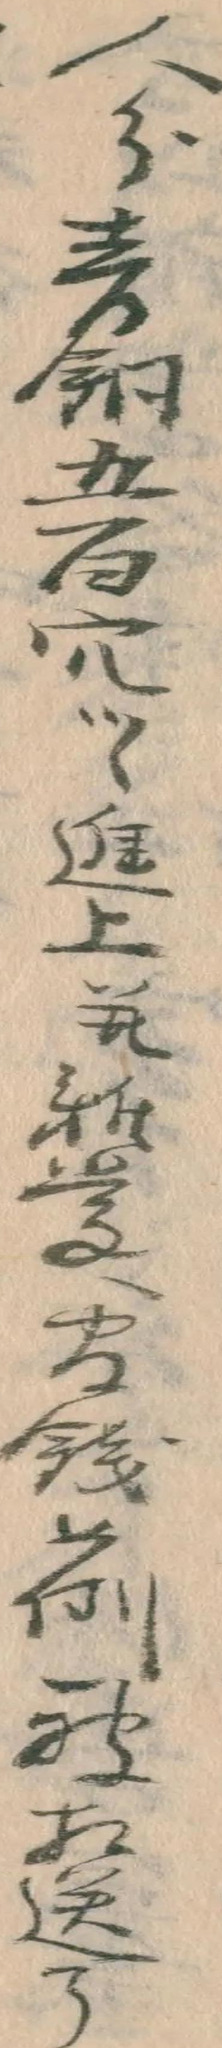人分青銅五百穴ツヽ進上并雑掌へ間銭如例被相送了
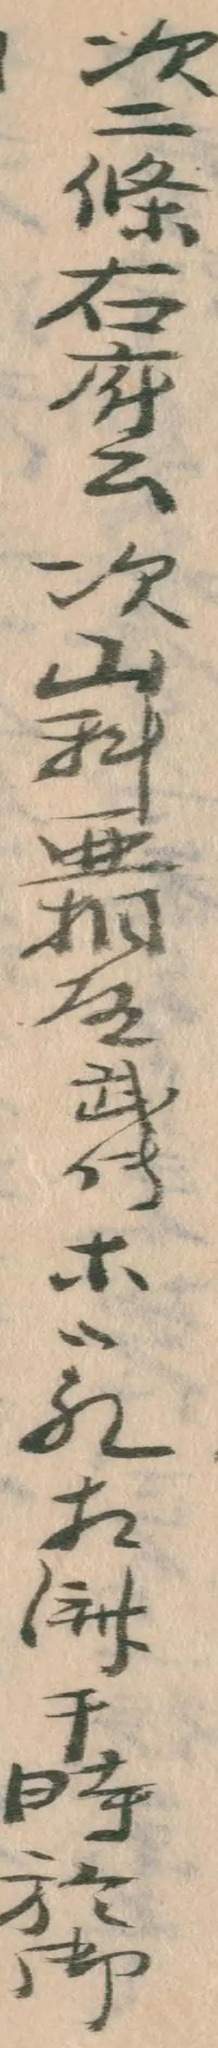次二條右府公次山科亜相殿武傳等御礼相済于時於御
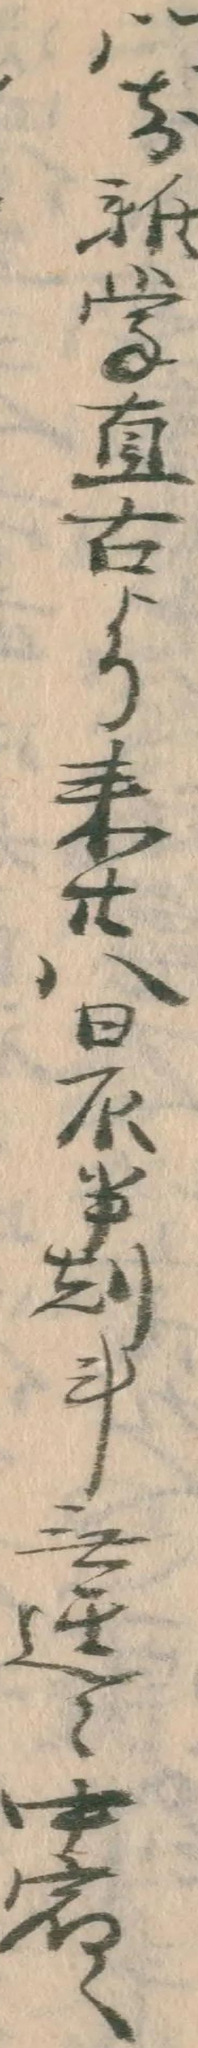門前雑掌直古より来廿八日辰半刻斗無遅々中宿へ
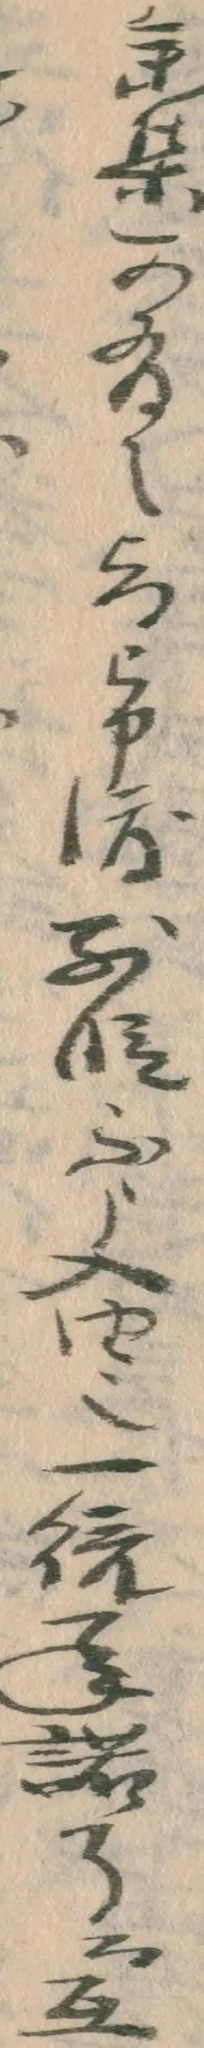参集可有之旨被申渡前段不申入由也一統承諾了而互
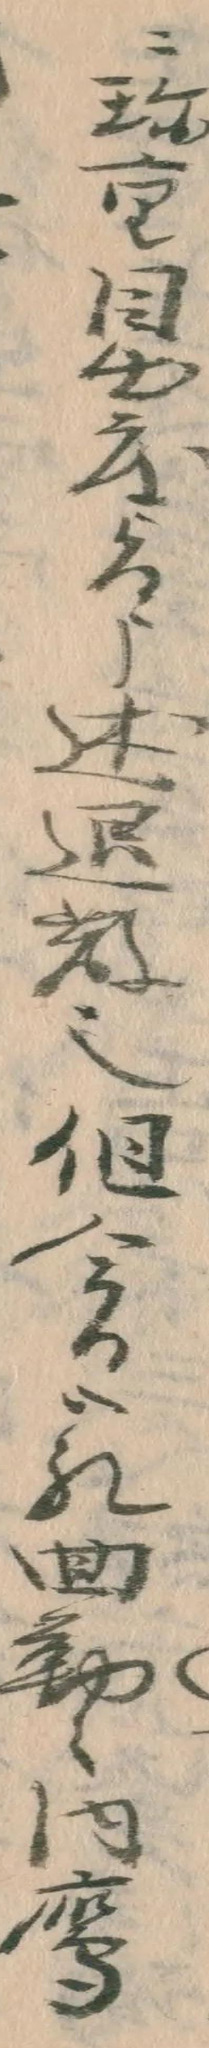ニ珍重目出度旨申述退散也但今日御礼回勤之内鷹
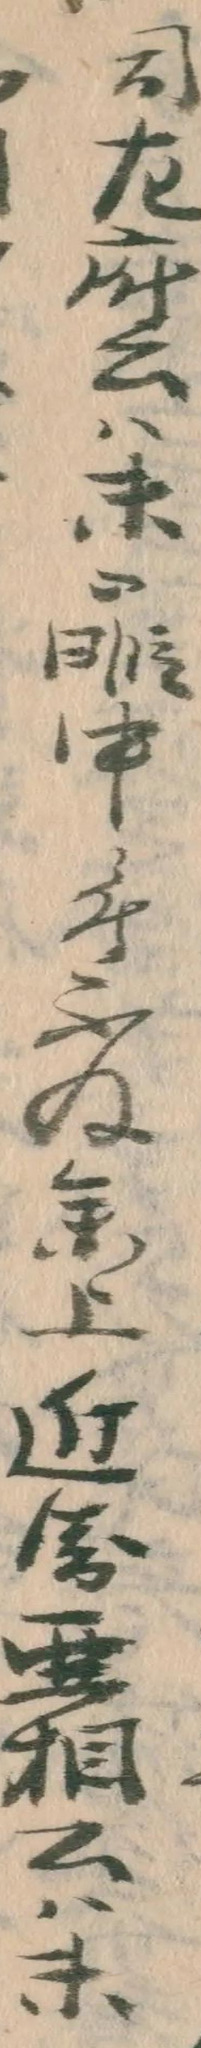司左府公ハ末御暇申ニ付不及参上近衛亜相公は未
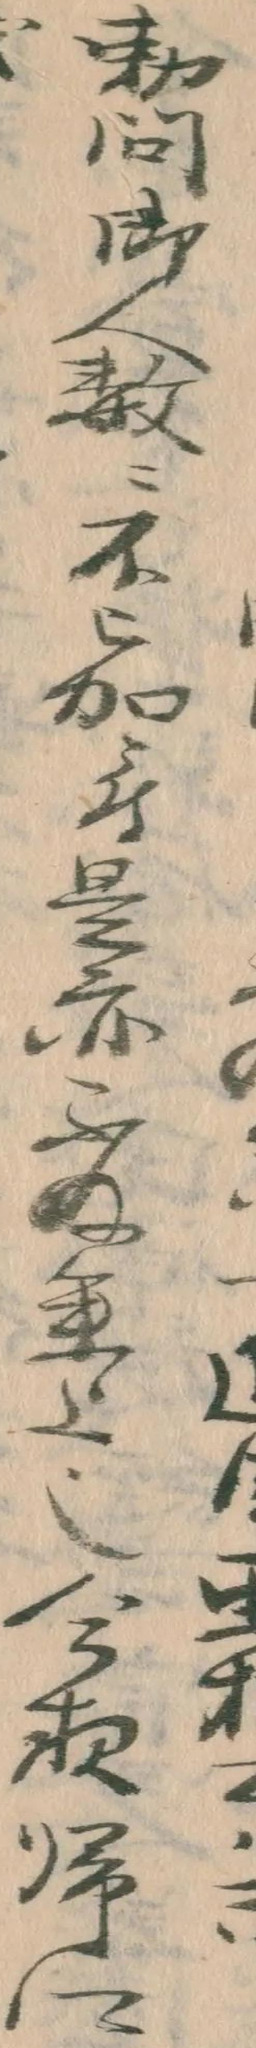勅問御人数ニ不被加ニ付是亦不及参上也今夜帰郷
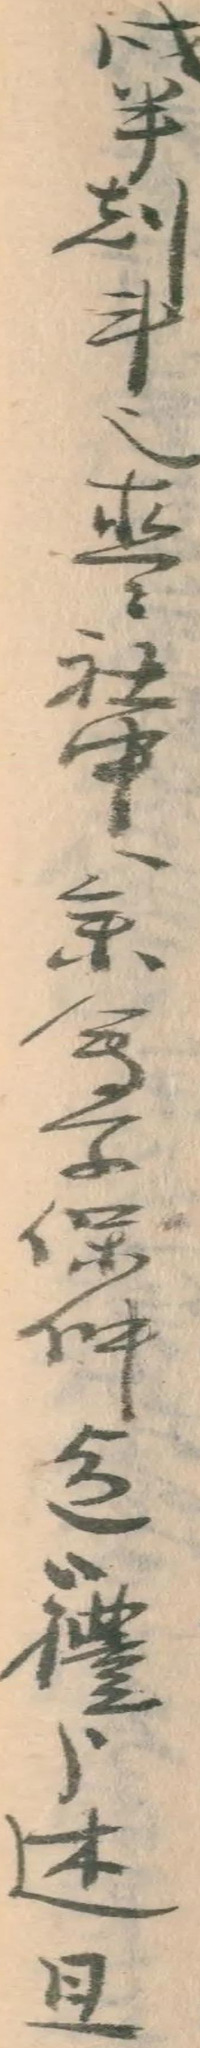戌半刻斗也直ニ社中へ参會所保仲迄御禮申述且
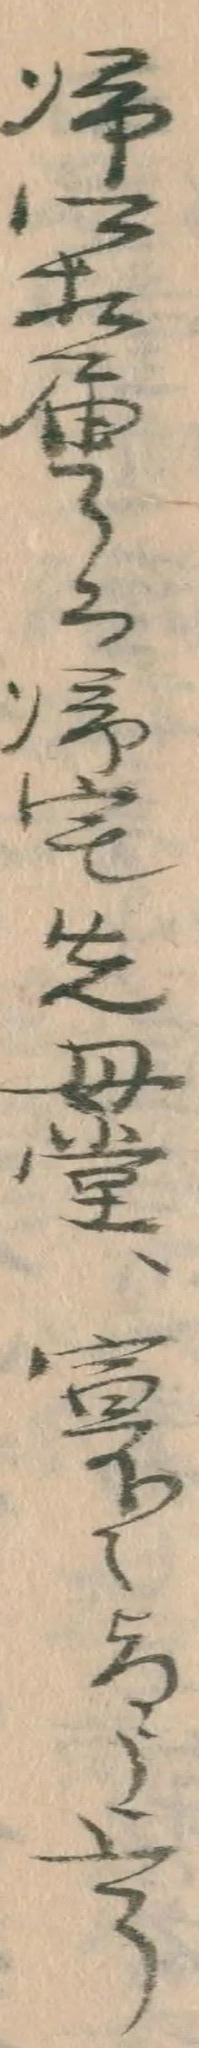帰郷相届了而帰宅先母堂へ宣下之旨被申上了
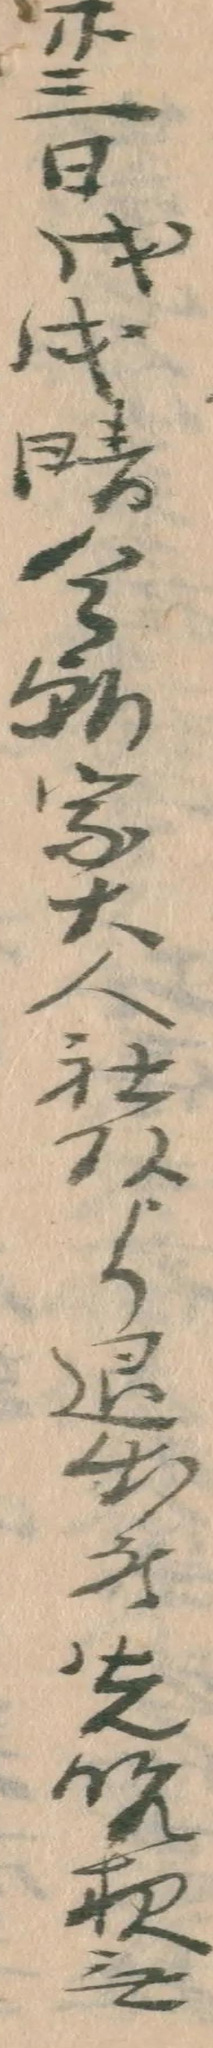廿三日戊戌晴今朝家大人社頭より退出方先晩夜無
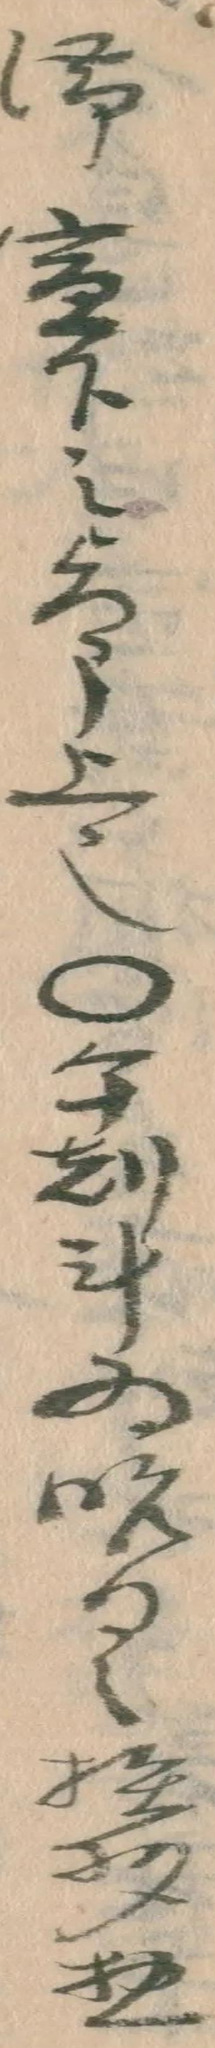滞宣下之旨申上也○午刻斗為昨日之挨拶惣
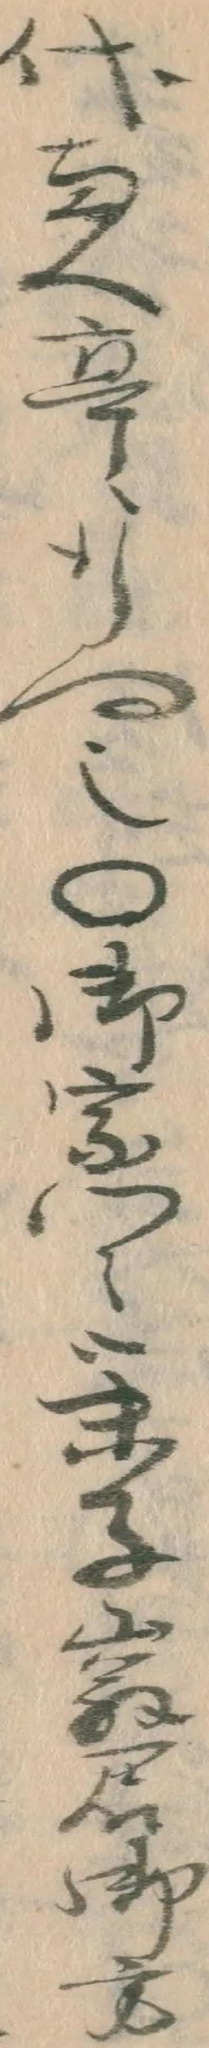代両人亭へ行向也○御家門之御末子嵡君御方
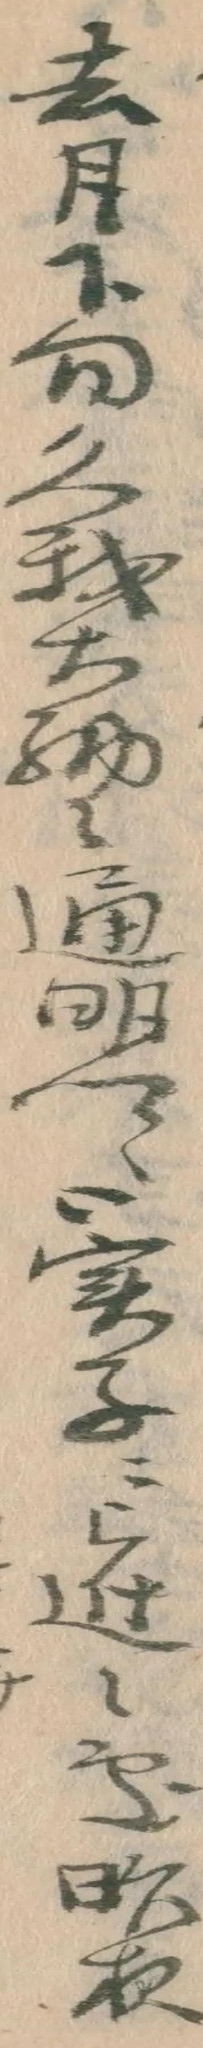去月下旬久我大納言通明卿へ御実子ニ被達候處昨夜
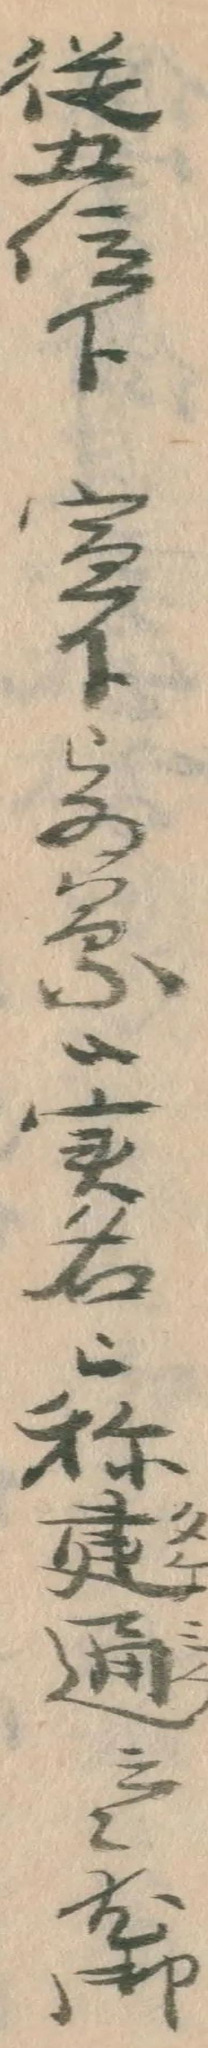従五位下宣下被為察御実名被称建通云々尤御
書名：賀茂社記録. 第63冊
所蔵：国立国会図書館 National Diet Library, JAPAN
